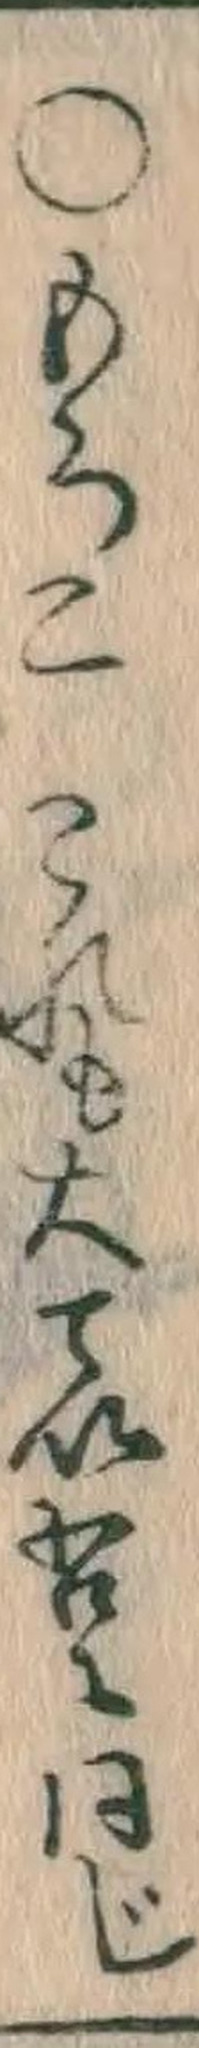○もろここれも大てい右の同じ
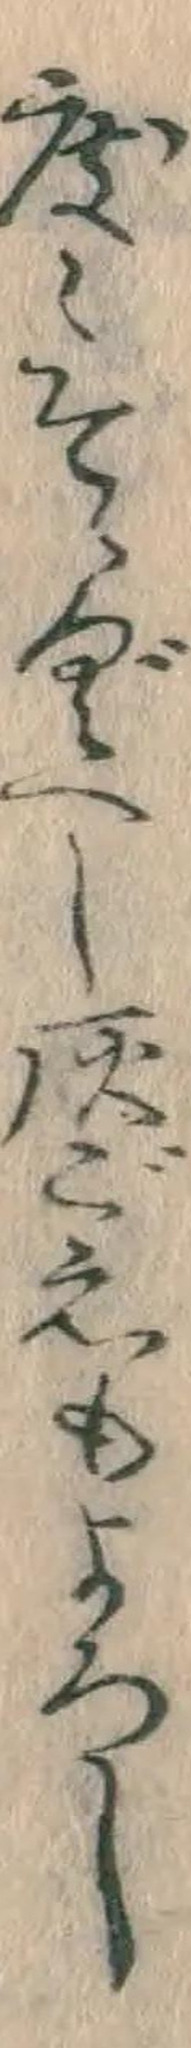度々そゝぐへし灰ごえもよろし
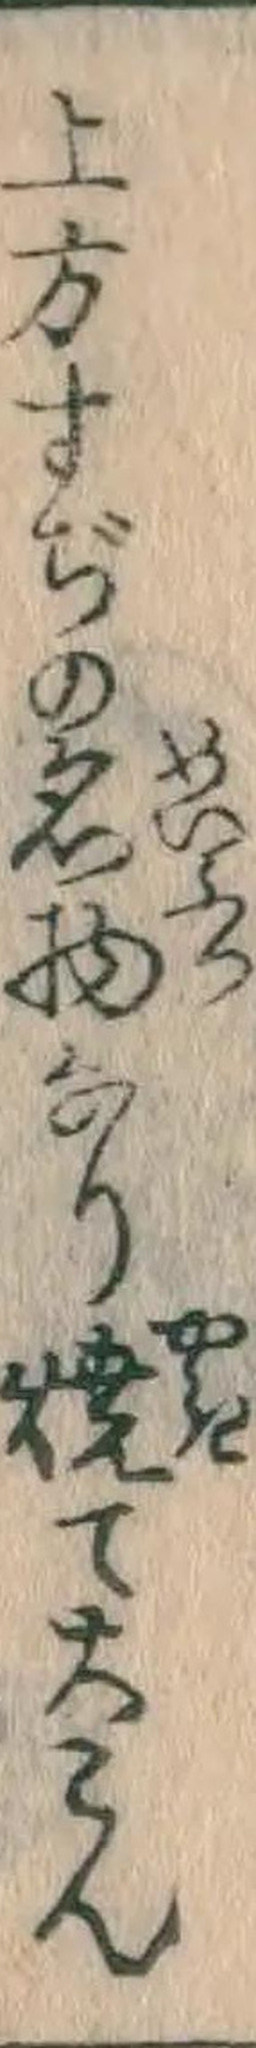上方すぢの名物なり焼て大こん
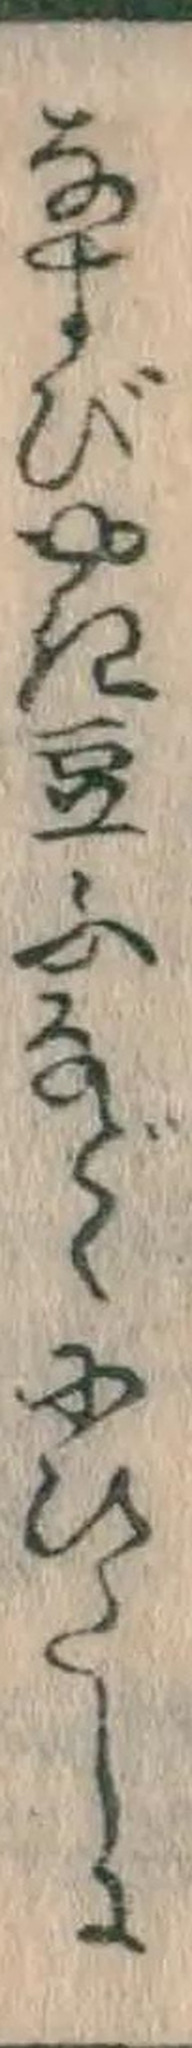なすびやき豆ふなどゝにひたしに
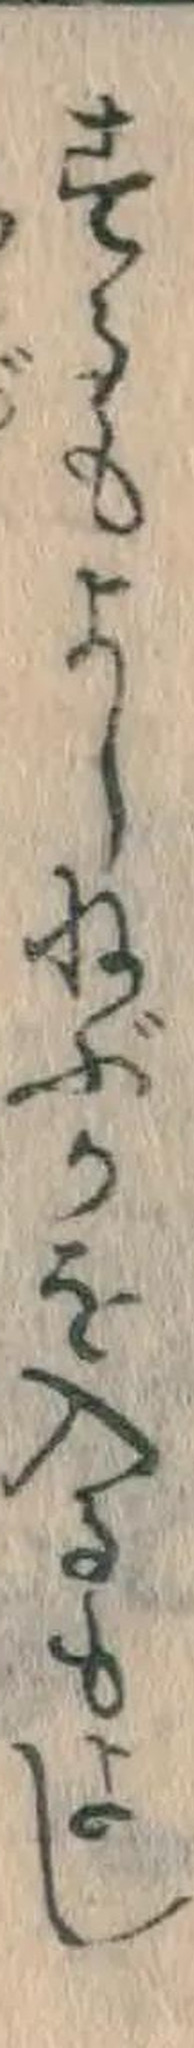するもよしねぶかを入るもよし
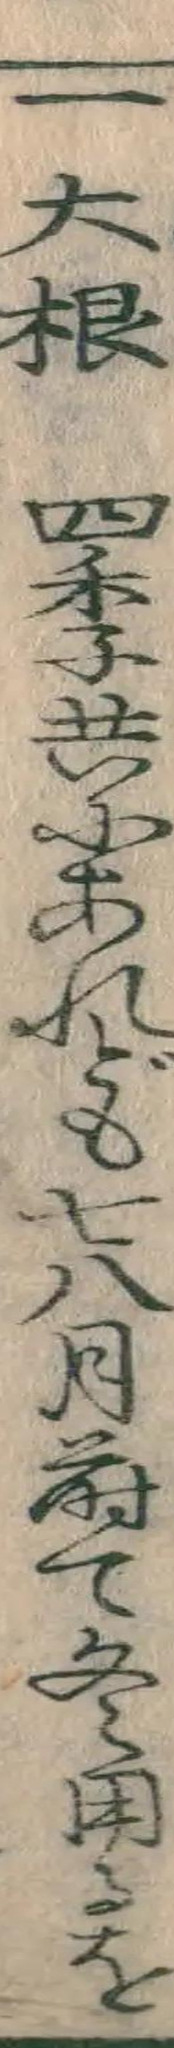一大根四季共にあれども七八月蒔て冬用るを
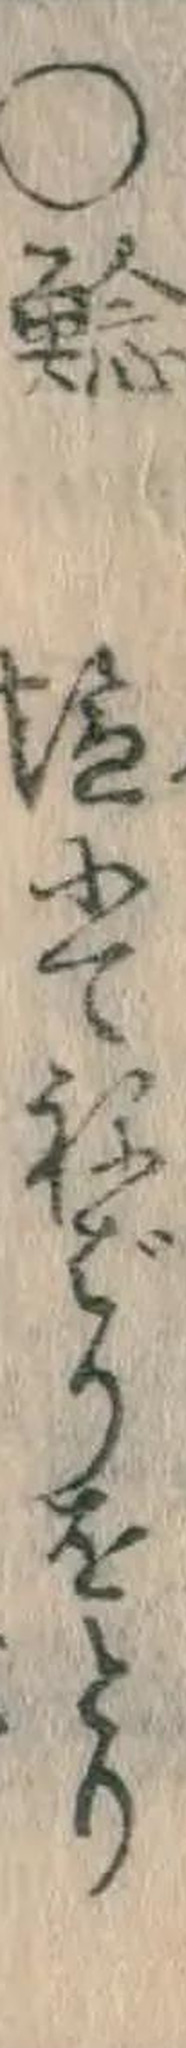○鯰塩にてねばりをとり
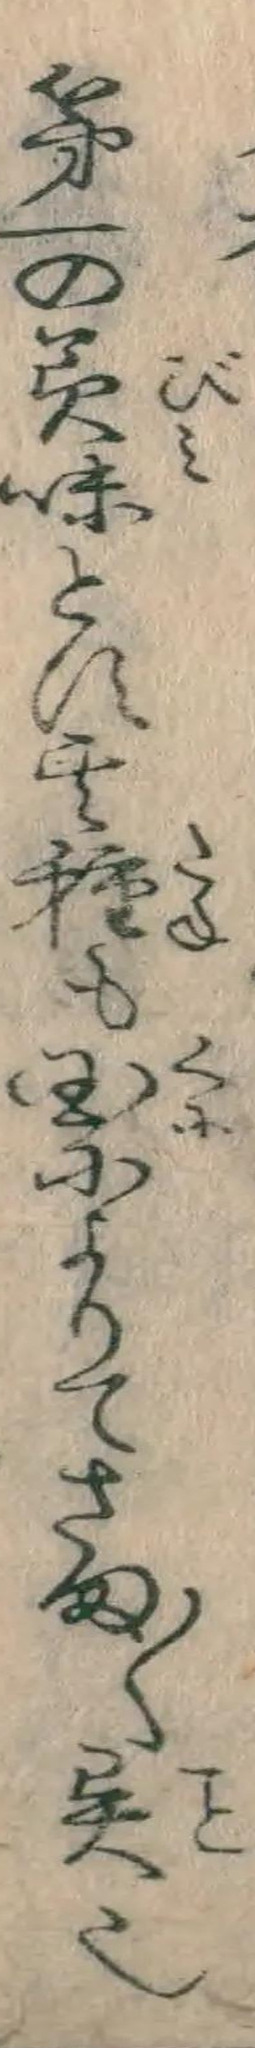第一の美味とす其種も国によりてさま〳〵異也
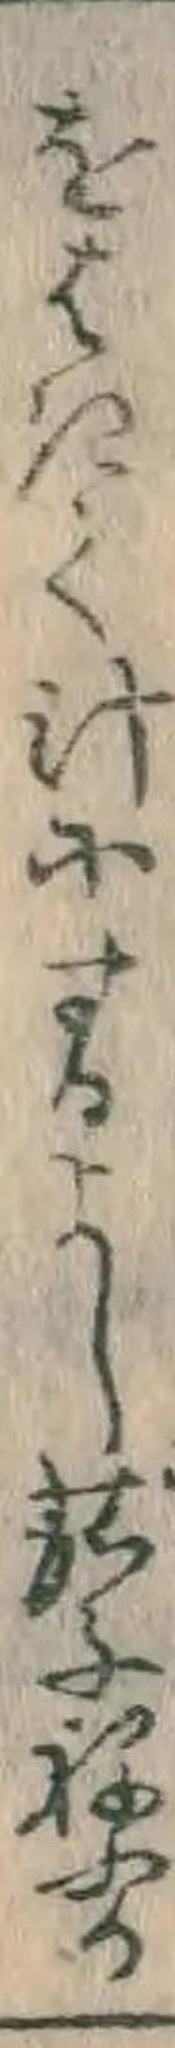をはきて汁にするよし茄子ねふか
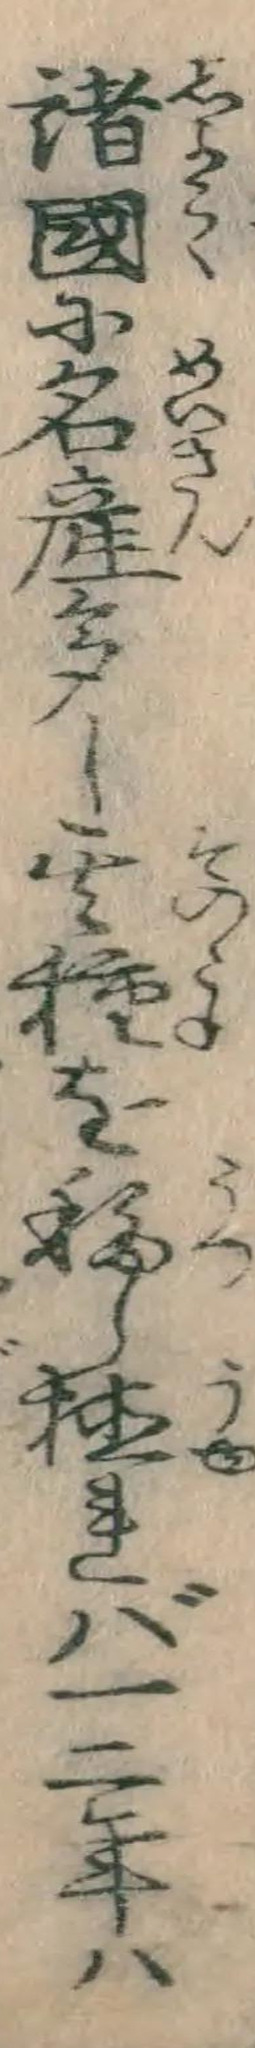諸国に名産多し其種を移し植れば一二年は
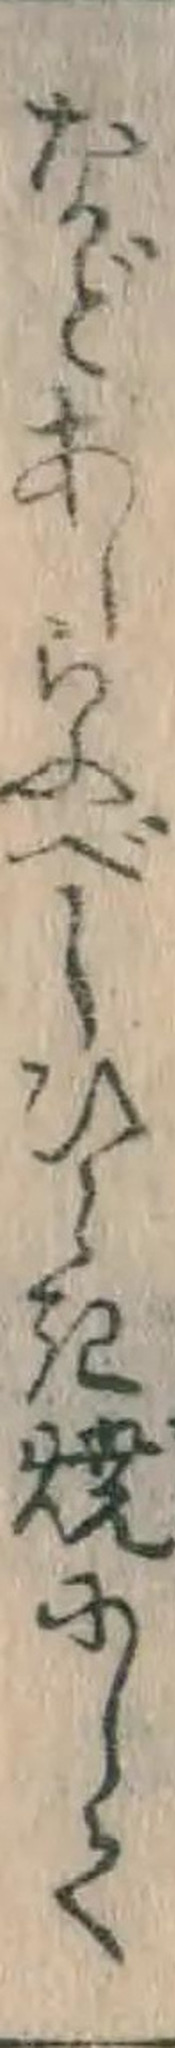などあしらふべしひらき焼にして
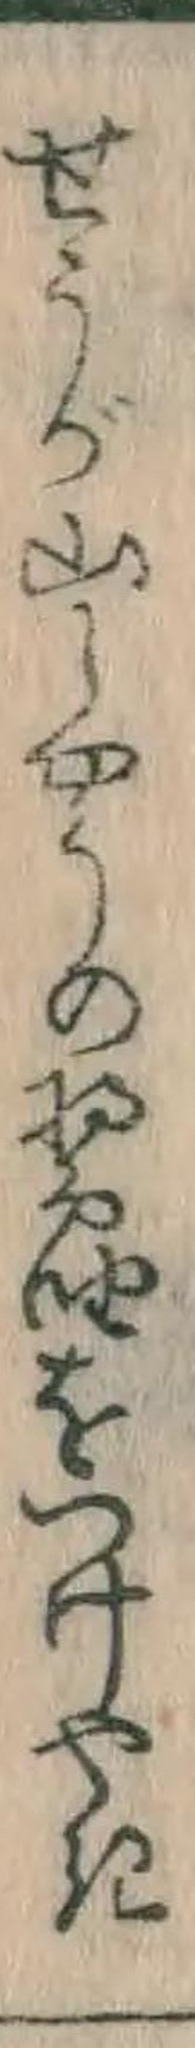せうが山しやうの醬油をつけやき
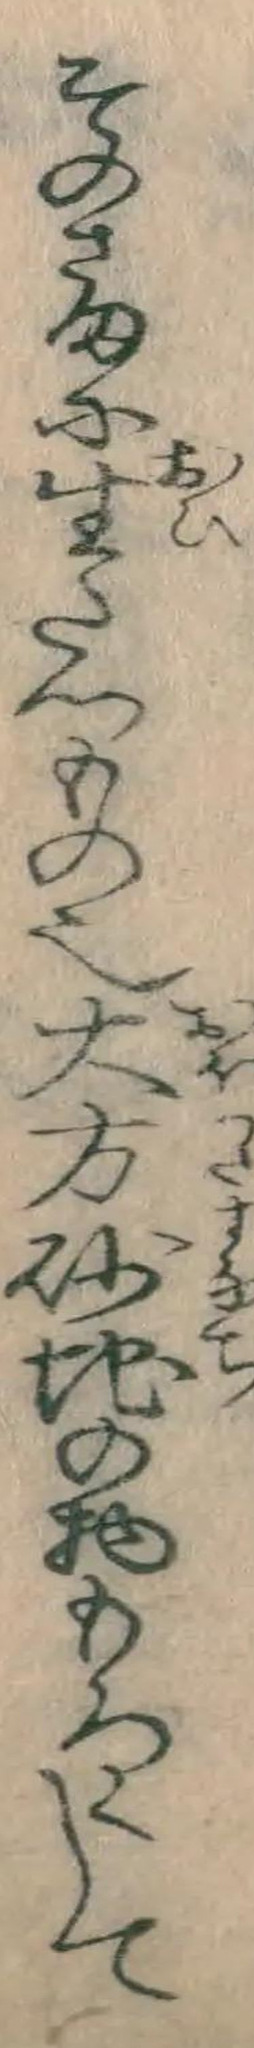そのさまに生たつもの也大方砂地の物もろくして

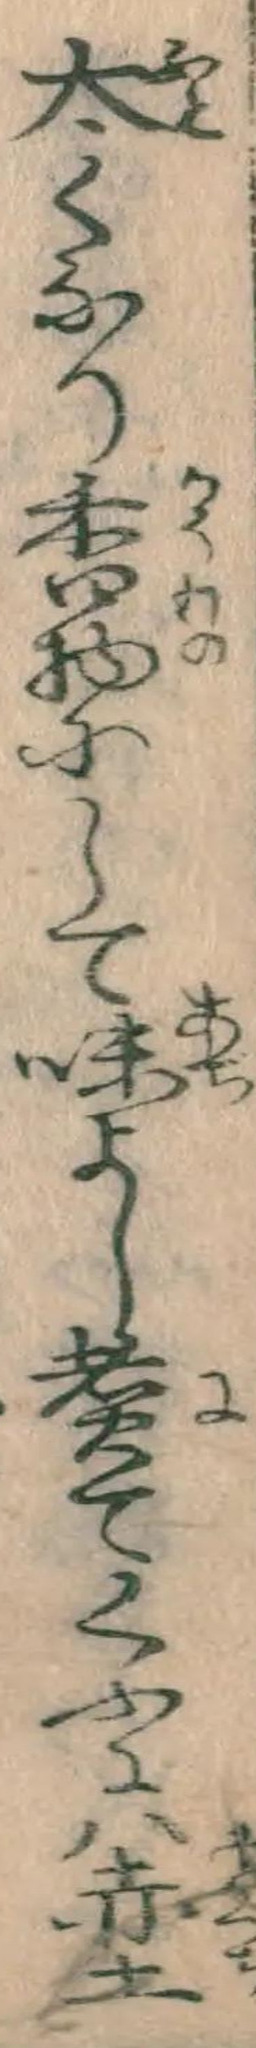太くなり香物にして味よし煮てくふには赤土
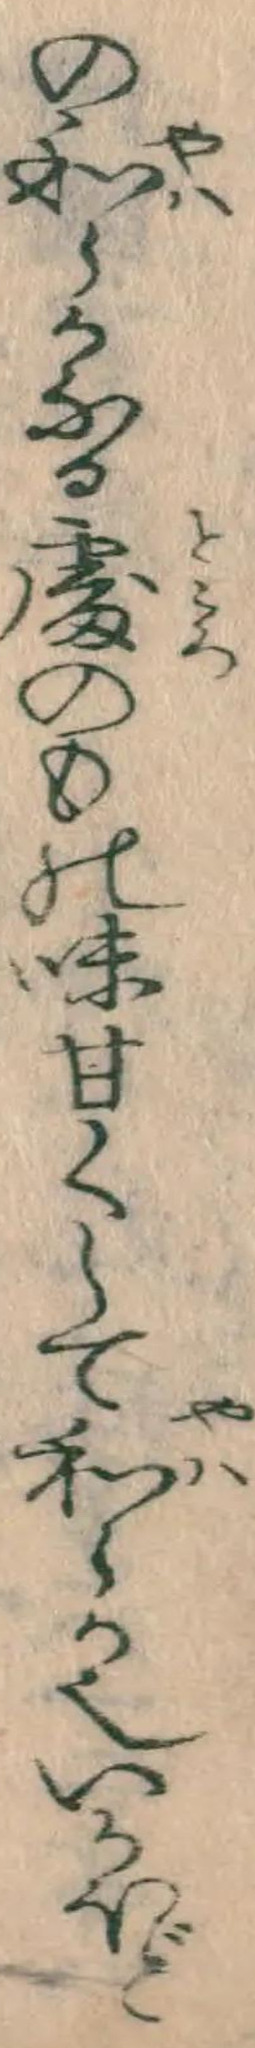の和らかなる処のもの味甘くして和らか也いかほど
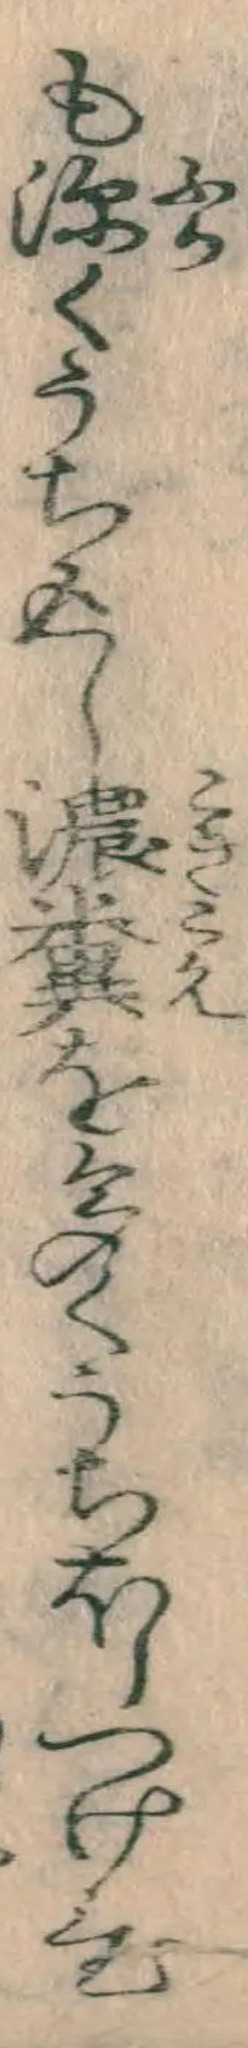も深くうち返し濃糞を多くうちほしつけ置
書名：広益秘事大全 3巻. [5]
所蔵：国立国会図書館 National Diet Library, JAPAN
